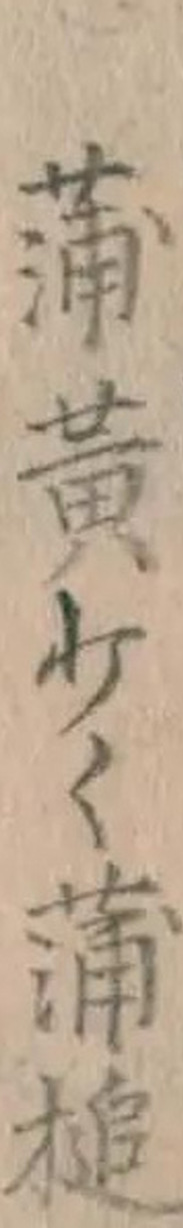蒲黄少く蒲槌

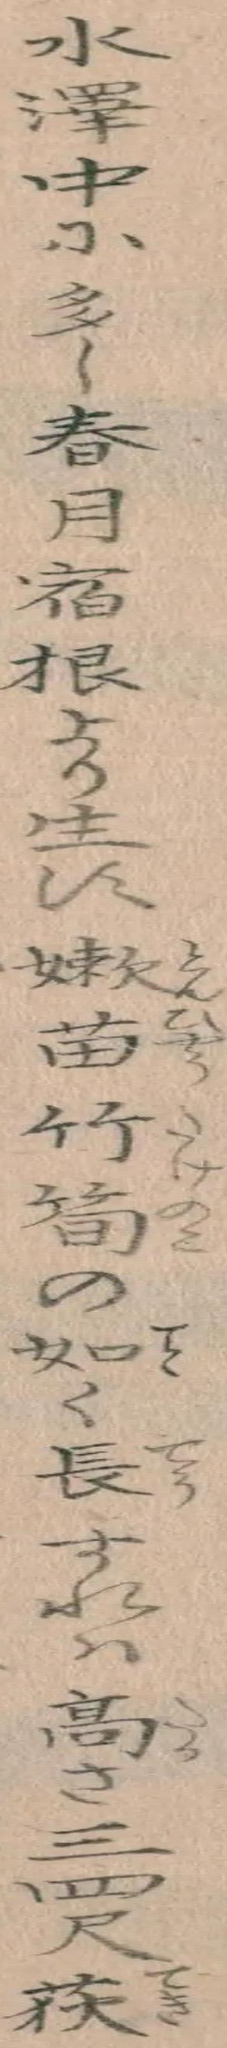水沢中に多し春月宿根より生す嫩苗竹筍の如く長すれは高さ三四尺荻
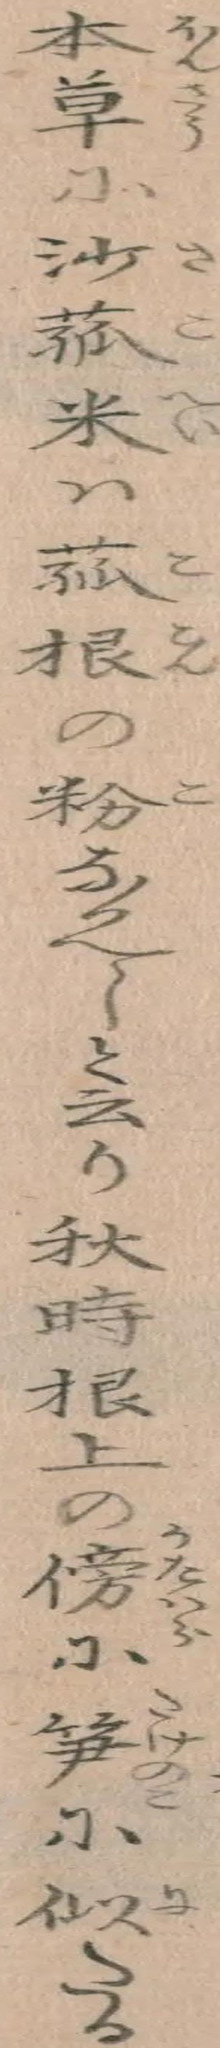本草に沙菰米は菰根の粉なるへしと云り秋時根上の傍に笋に似たる
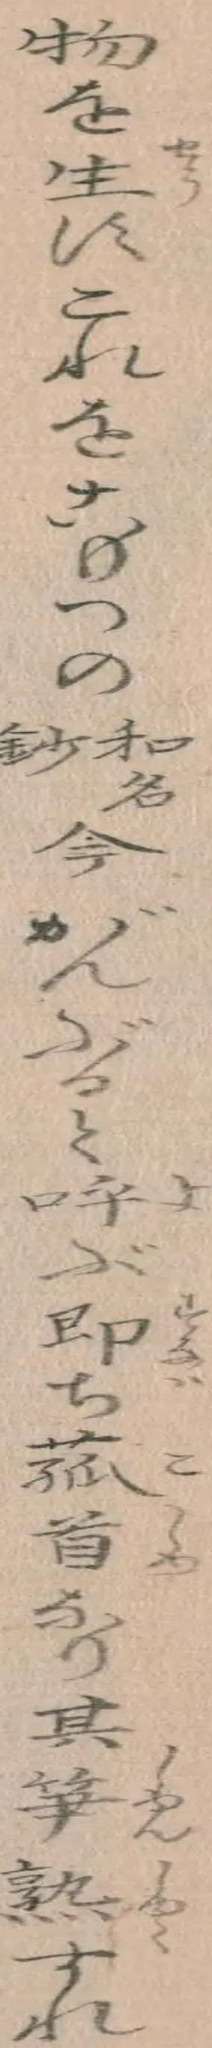物を生すこれをこもつの和名抄今がんぶると呼ぶ即ち菰首なり其笋熟すれ
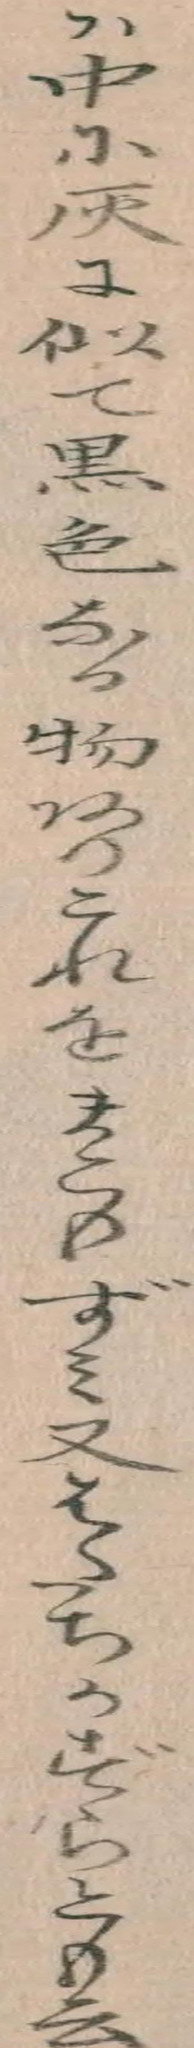は中に灰に似て黒色なる物ありこれをまこもずみ又はたちかずらとも云
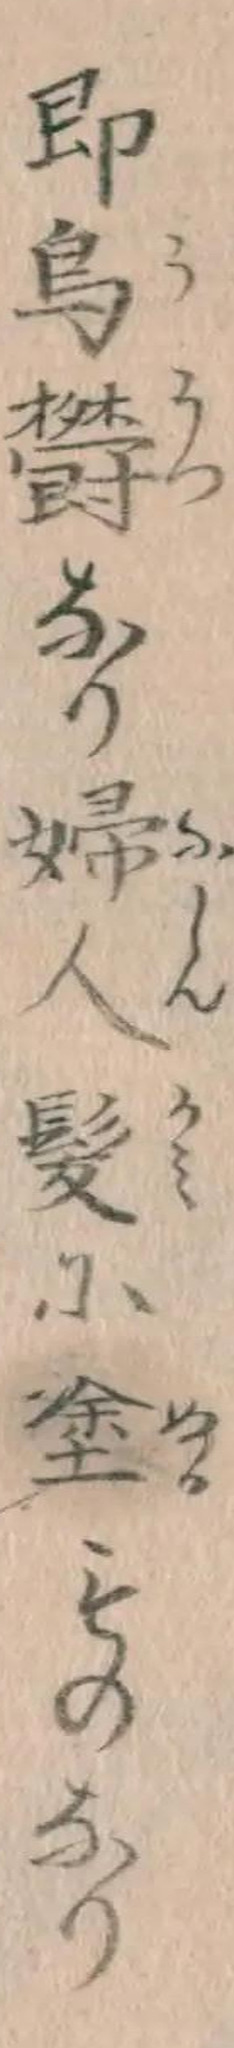即烏鬱なり婦人髪に塗ものなり

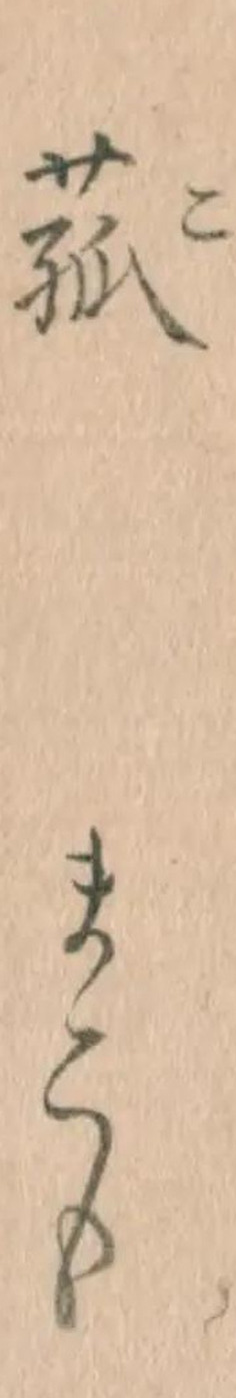菰まこも
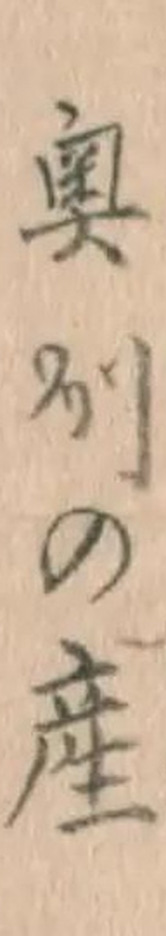奥州の産

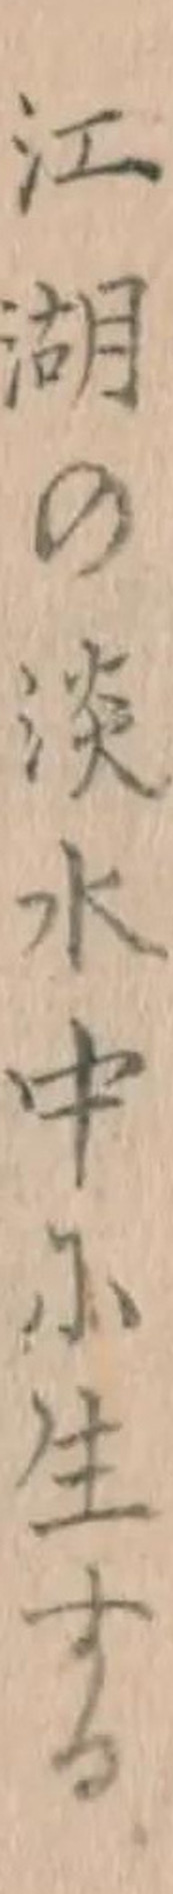江湖の淡水中に生する
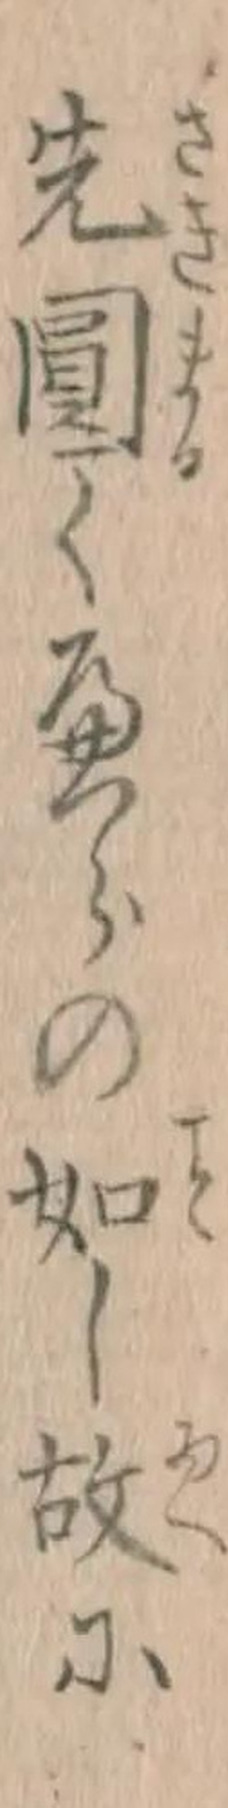先円くへらの如し故に
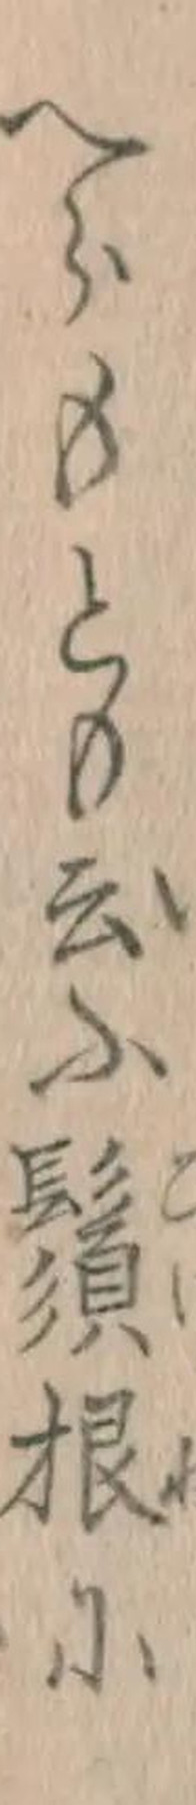へらもとも云ふ鬚根に
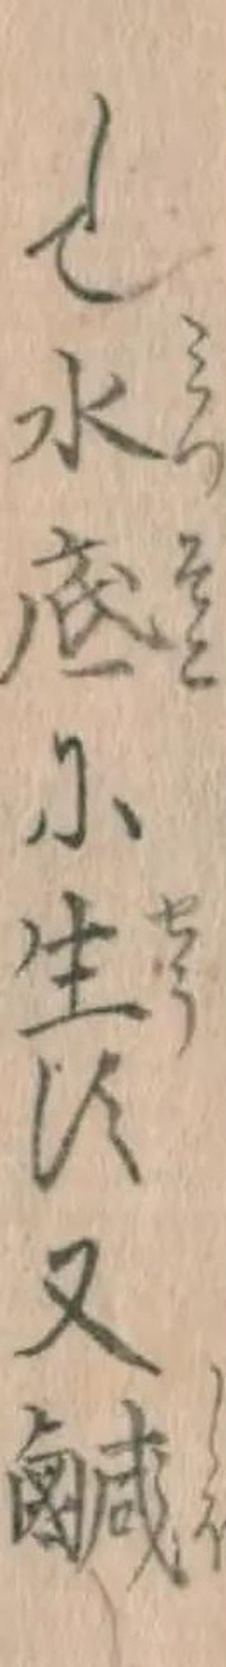して水底に生す又鹹
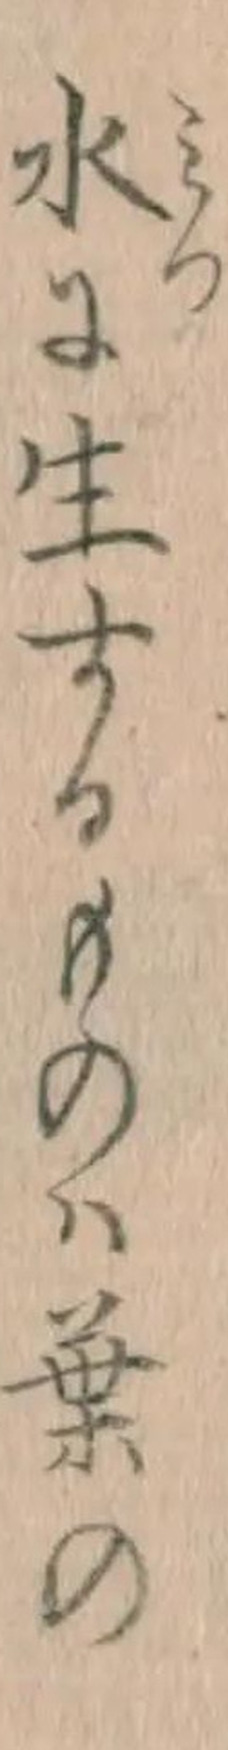水に生するものは葉の
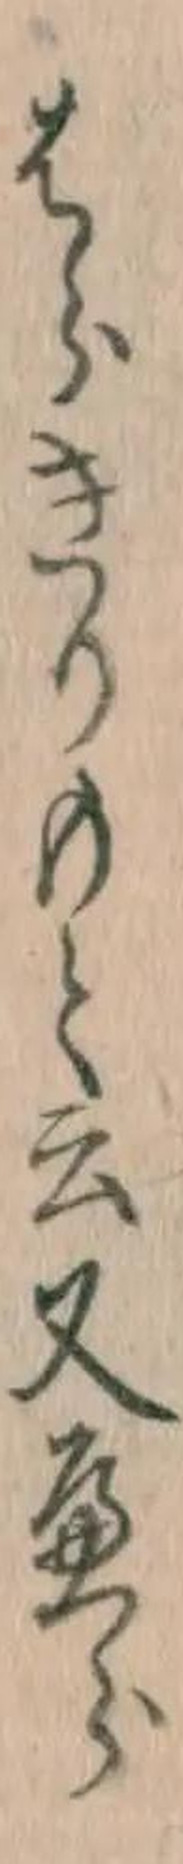はらきりもと云又へら
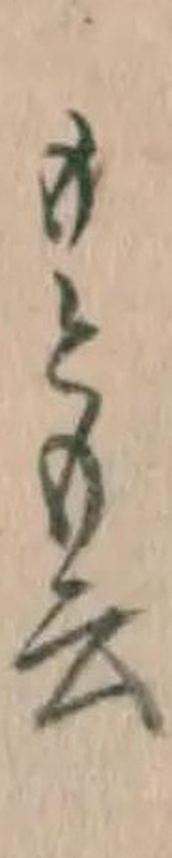もとも云
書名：本草図譜. 巻31-33
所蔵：国立国会図書館 National Diet Library, JAPAN
